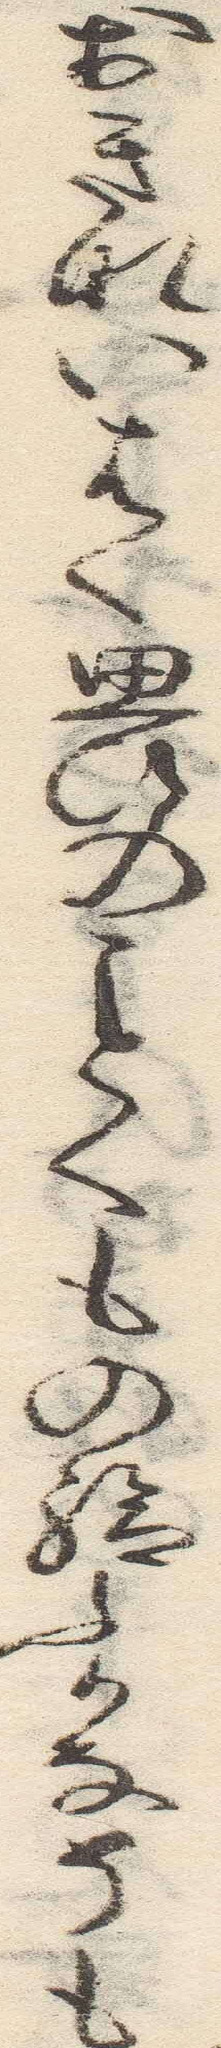おきないはく思ひのことくもの給ふかなそも
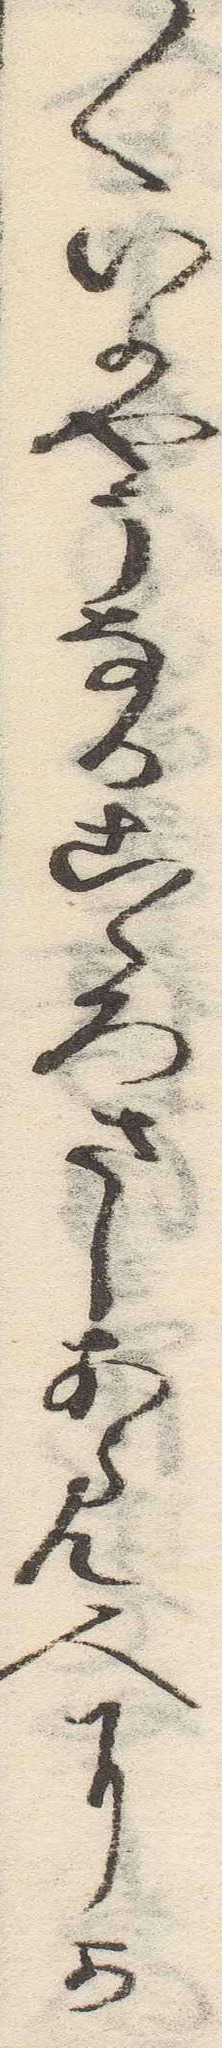〳〵いかやうなるこゝろさしあらん人にか
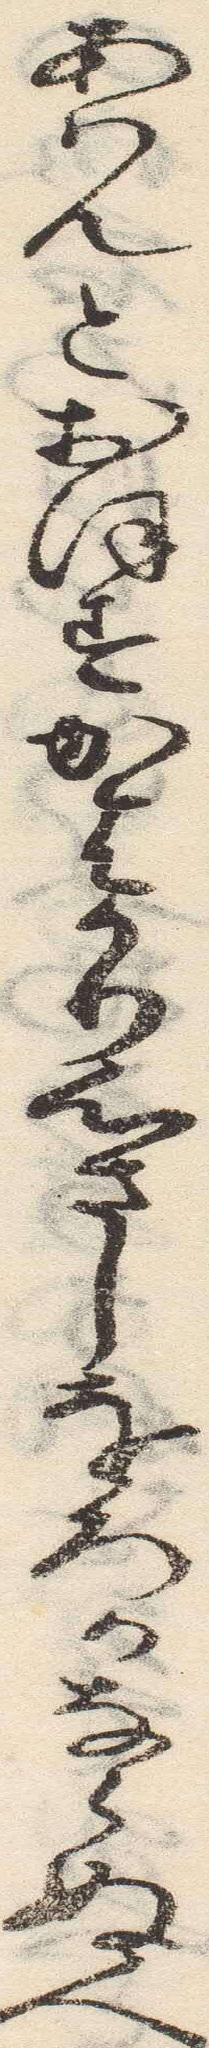あはんとおほすかはかり心さしをろかならぬ人
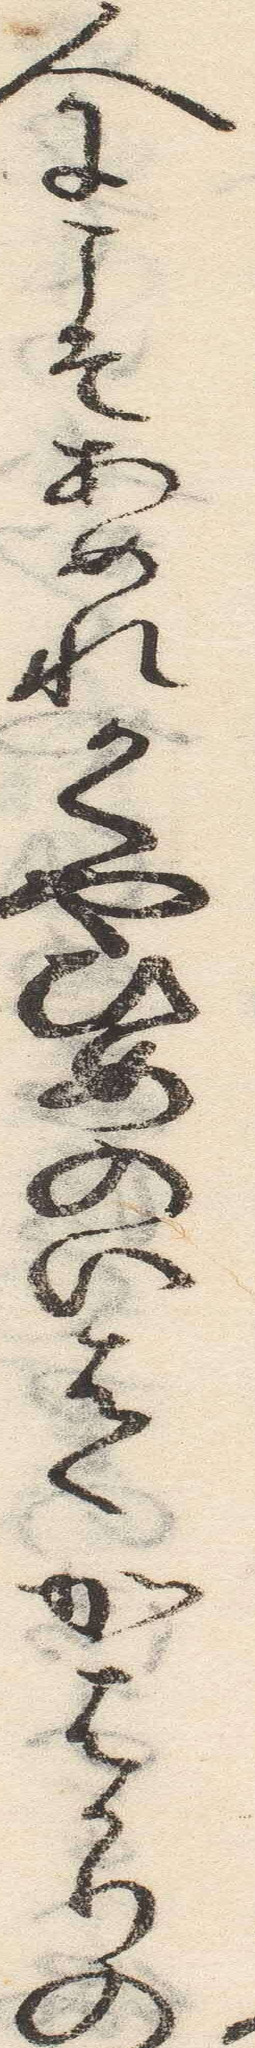人にことあめれかくやひめのいはくかはかりの
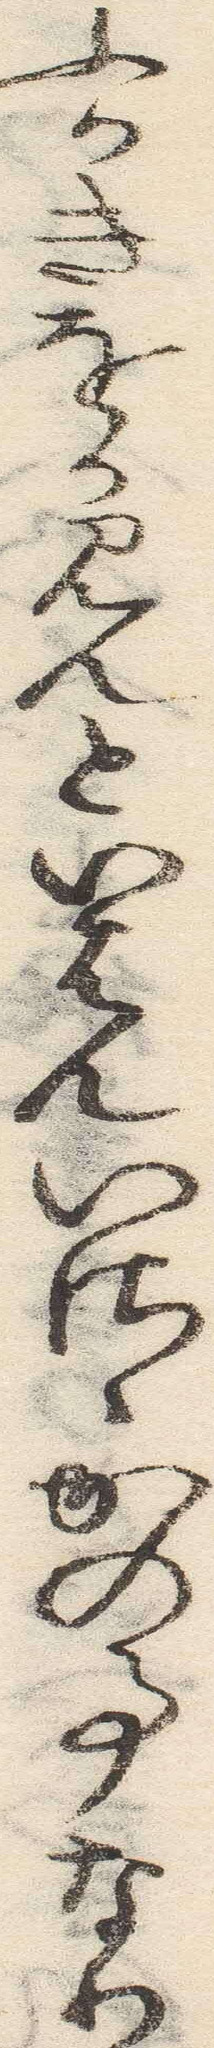ふかきをか見んといはんいさゝかの事なり
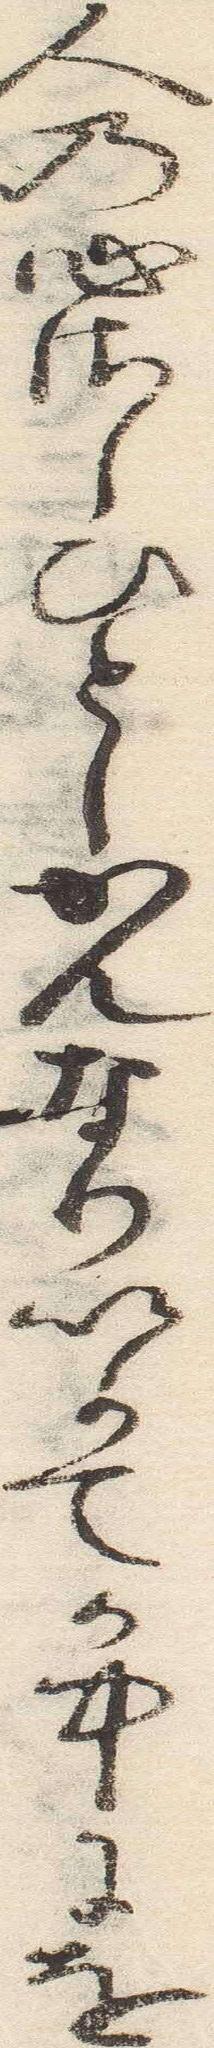人の心さしひとしかんなりいかてか中にを
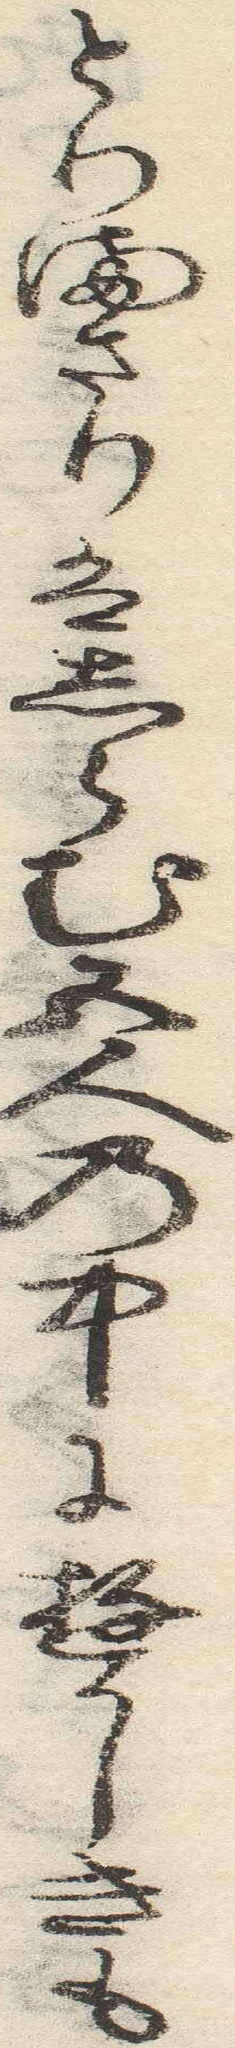とりまさりはしらん五人の中にゆかしきも
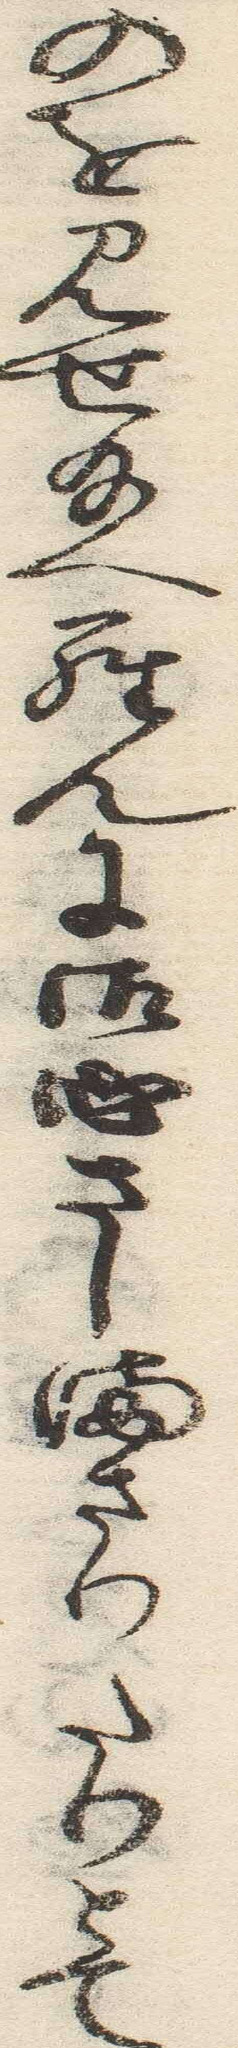のを見せ給へらんに御心さしまさりたりとて
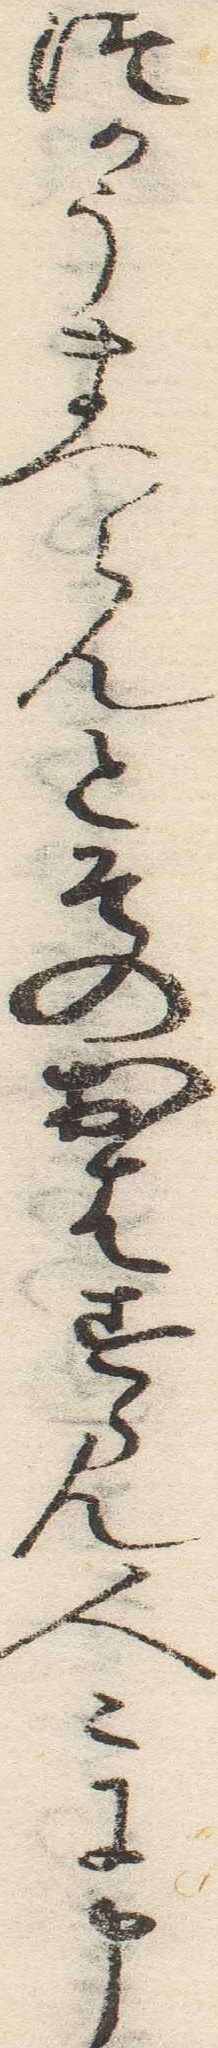つかうまつらんとそのおはすらん人々に申
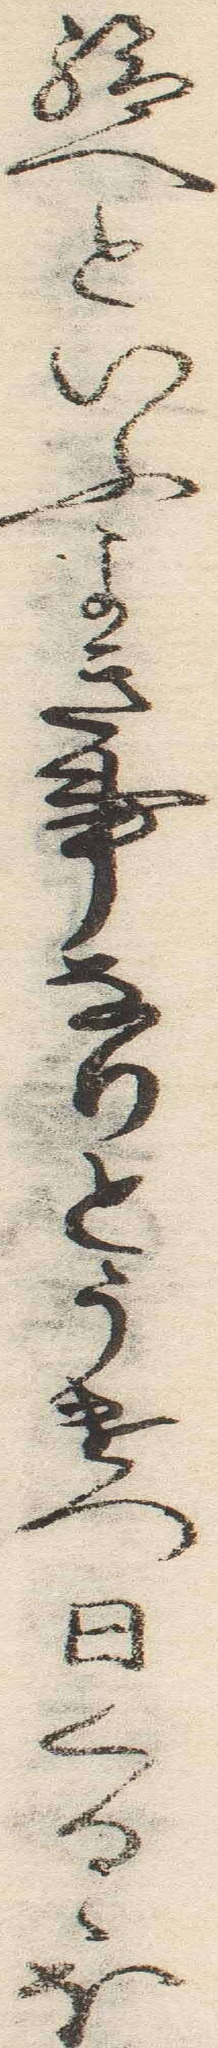給へといふよき事なりとうけつ日くるゝほ
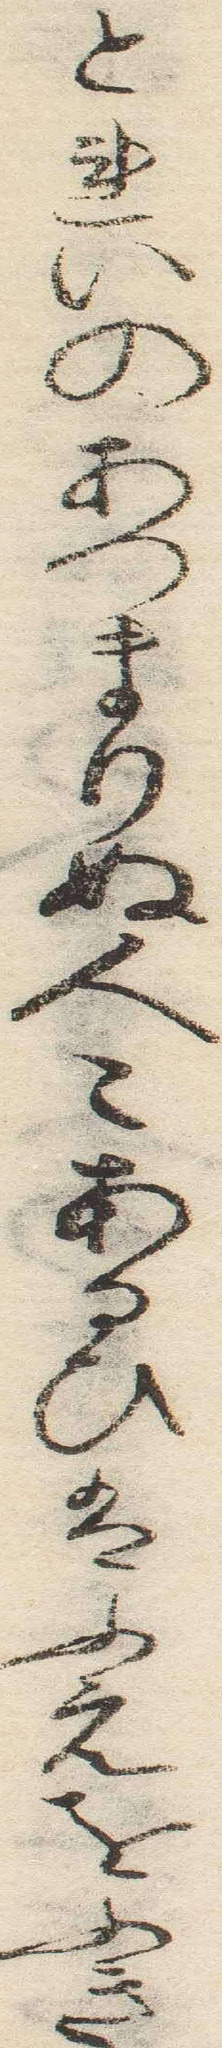とれいのあつまりぬ人々あるひはふえをふき
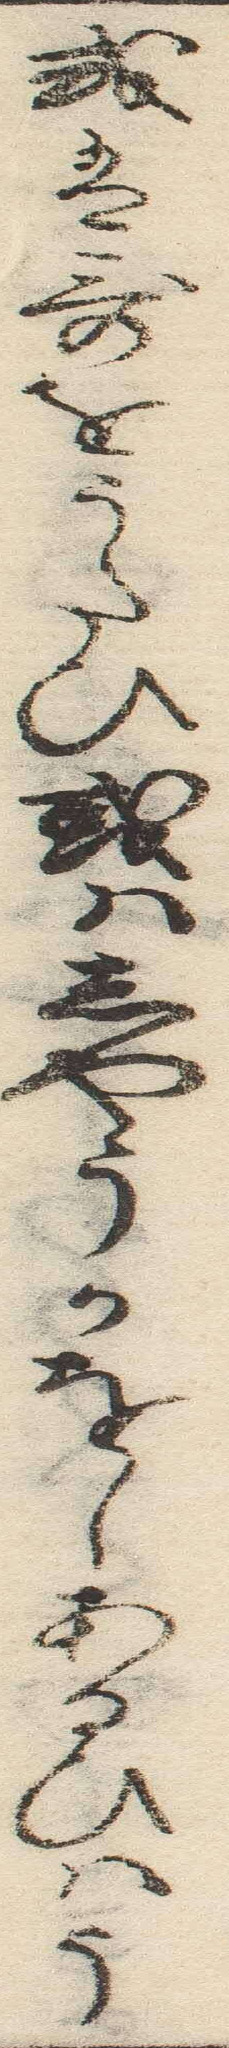或は歌をうたひ或はしやうかをしあるひはう
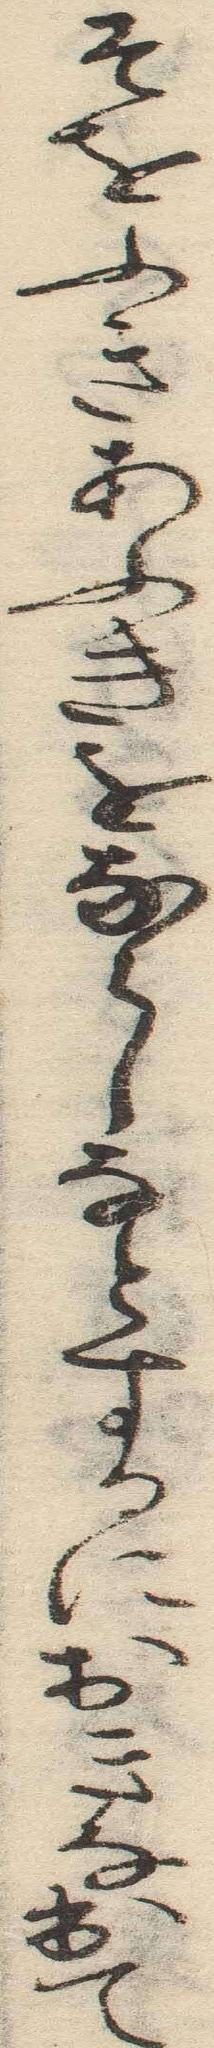そをふきあふきをならしなとするにおきな出て

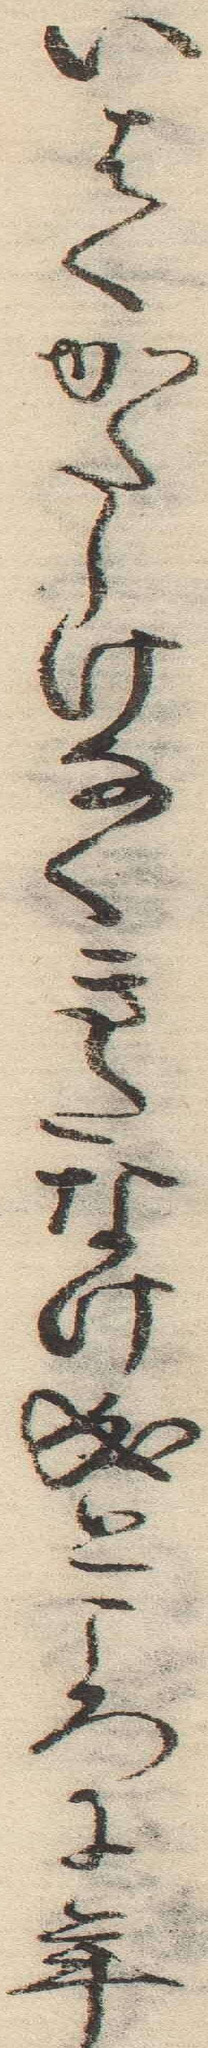いはくかたしけなくきたなけ成ところに年
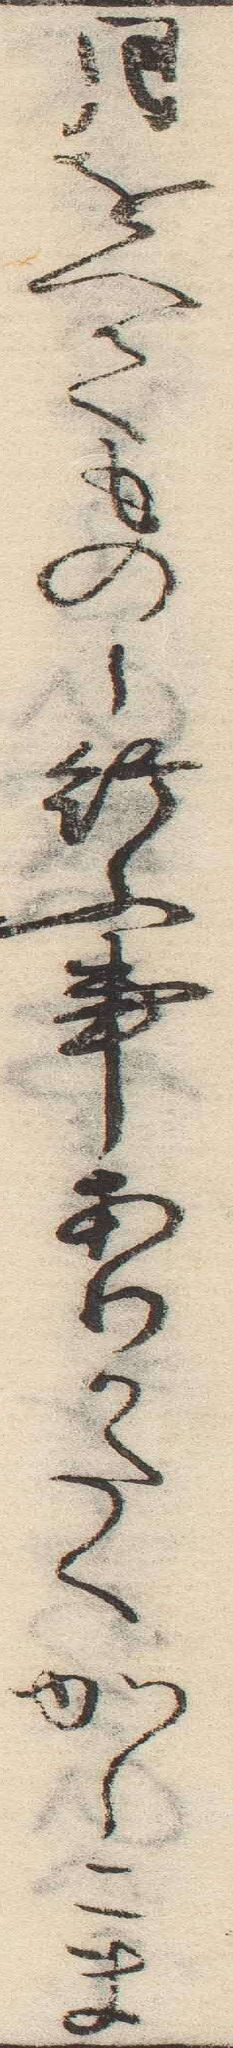月をへてものし給ふ事ありかたくかしこま
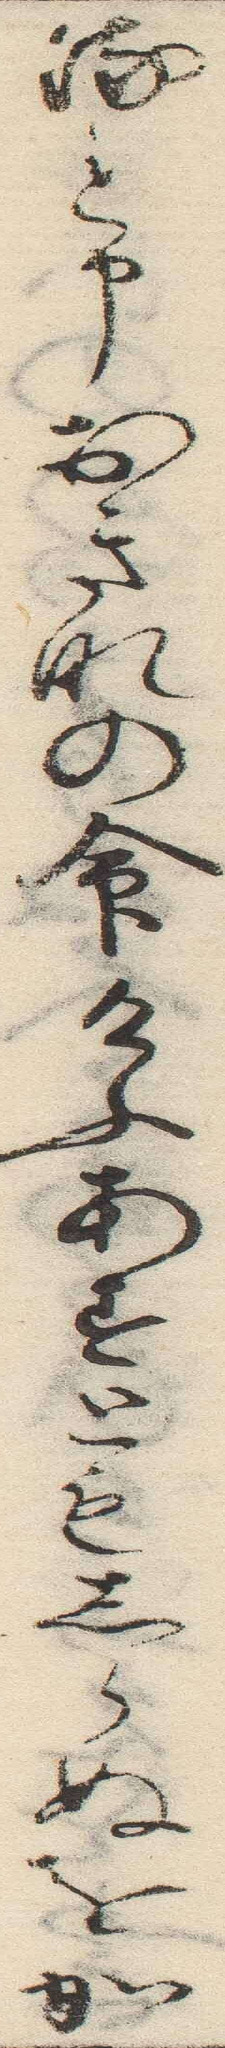ると申おきなの命けふあすともしらぬをか
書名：竹取物語
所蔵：東京学芸大学附属図書館 国文学研究資料館
